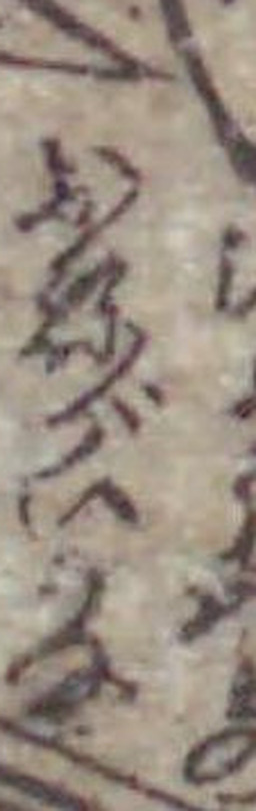おねがいかな
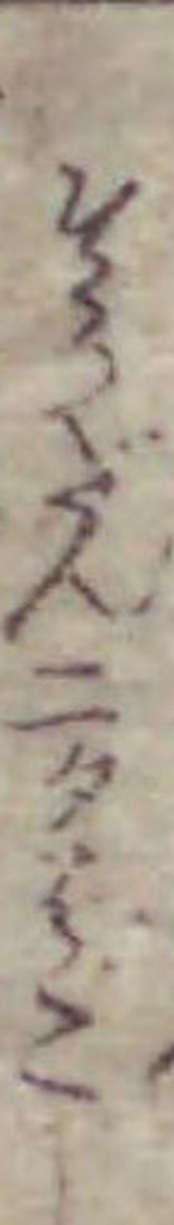そうだん二タはこ
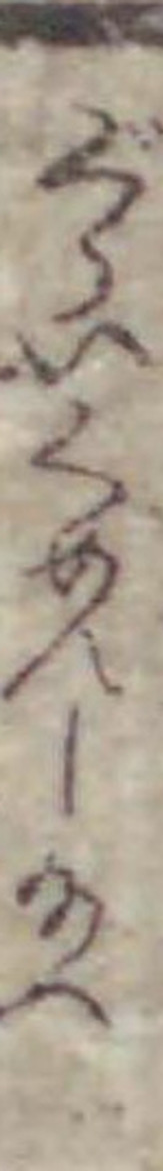ぐらいくめんし給へ
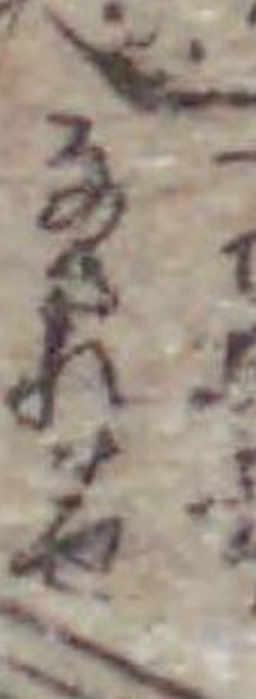なされませ
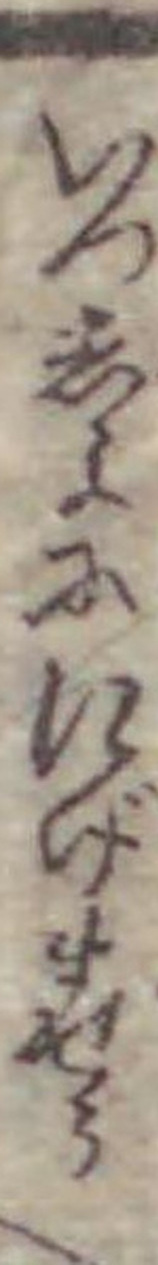いつしよににげませう
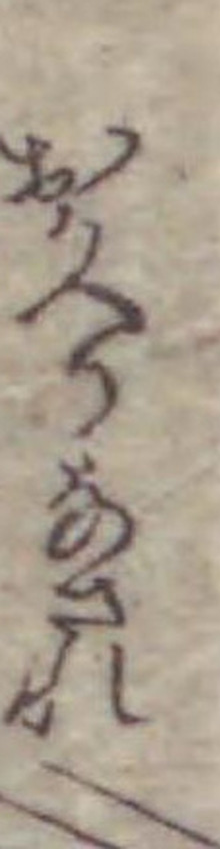おかへりなされ
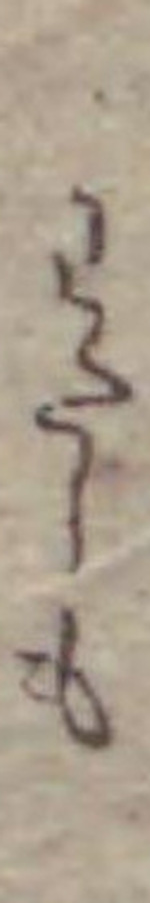わたしも
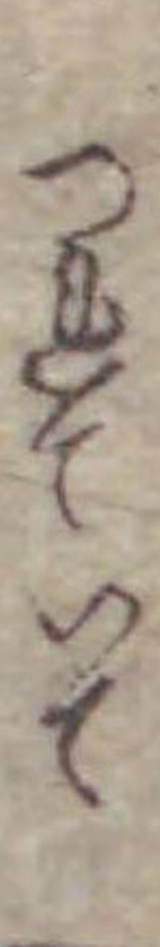つれていて
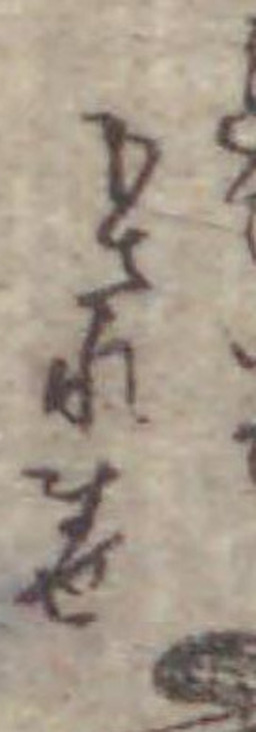下されませ

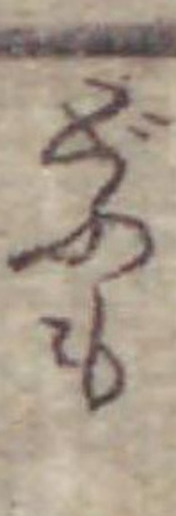どふも
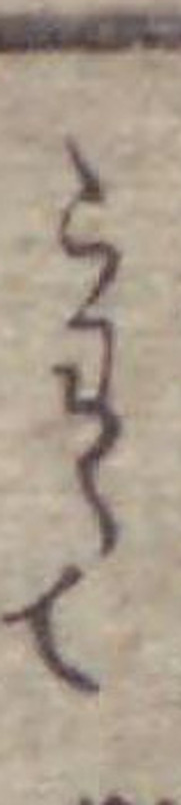こわくて
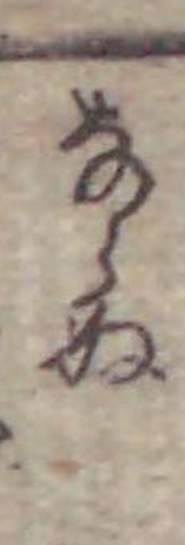ならぬ
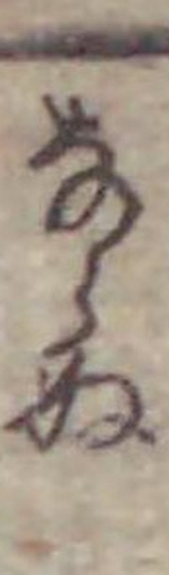ならぬ
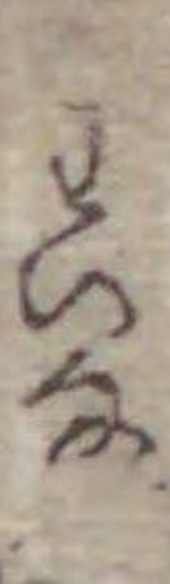わいな
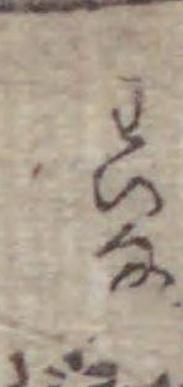わいな
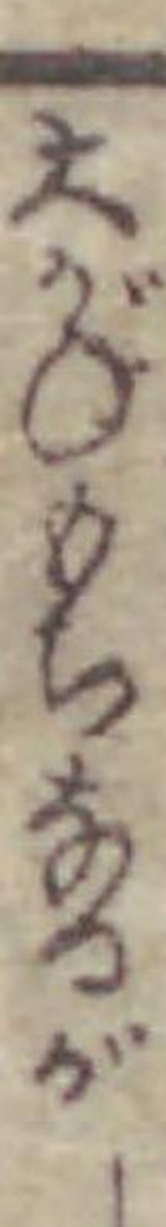大がねもちなるが
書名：嗚呼不侭世之助噺 : 3巻
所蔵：国立国会図書館 National Diet Library, JAPAN
